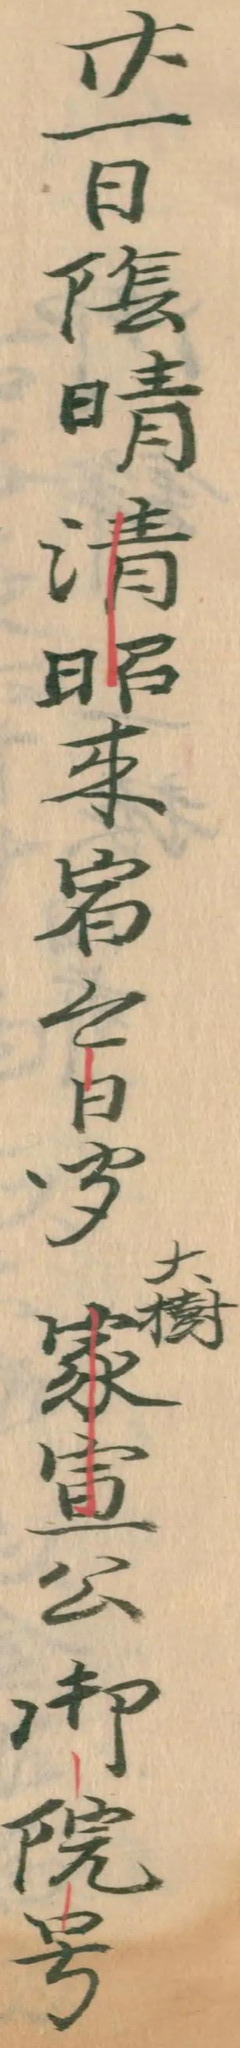廿一日陰晴清昭来宿今-日聞家宣公御-院-号
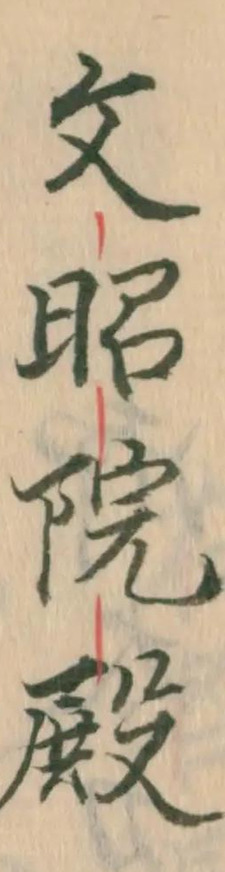文-昭-院-殿
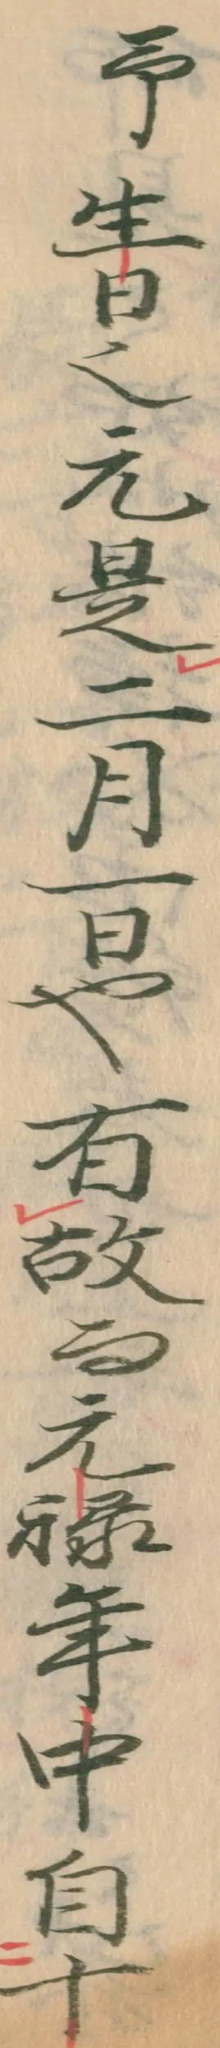予生-日也元是二月一日也有故而元-禄年-中自十-
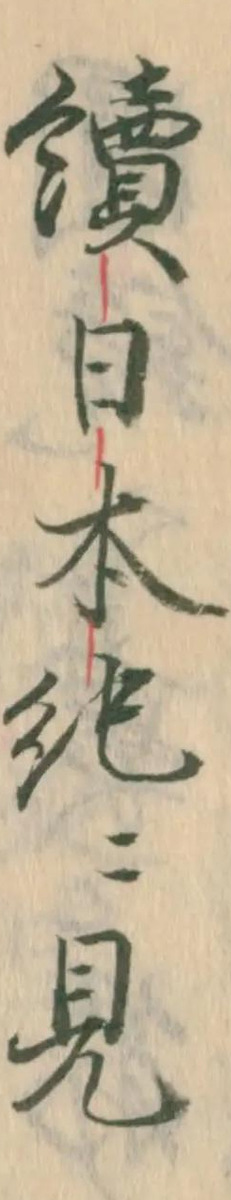続-日-本-紀ニ見
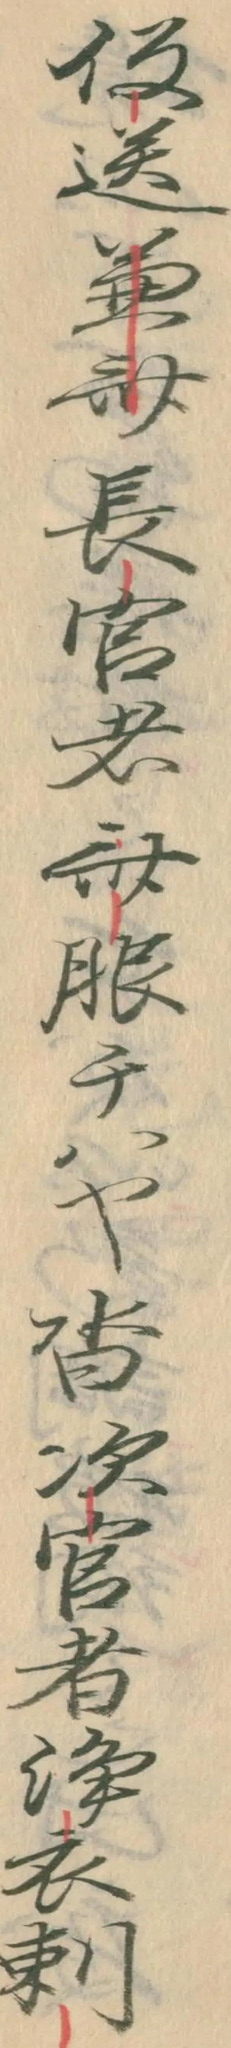役-送兼斎長-官者斎-服チハヤ沓次-官者浄-衣刺-
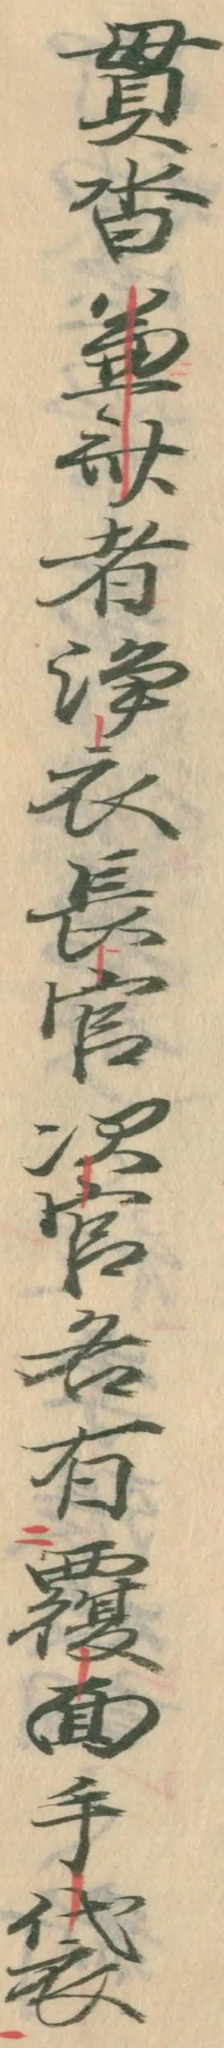貫沓兼斎者浄-衣長-官次-官各有覆-面手-袋

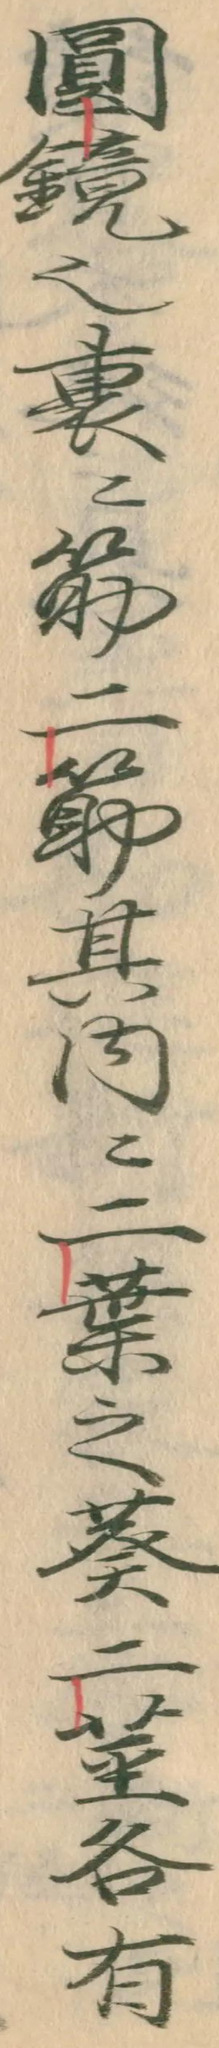円-鏡也裏二筋二_筋其内ニ二_葉之葵二_茎各有
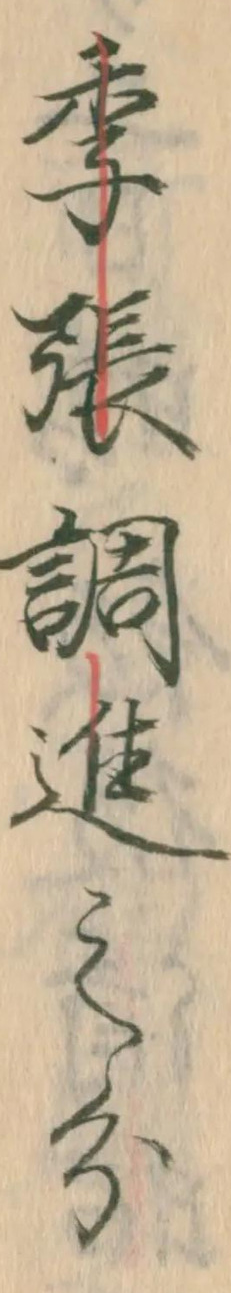季張調-進之分
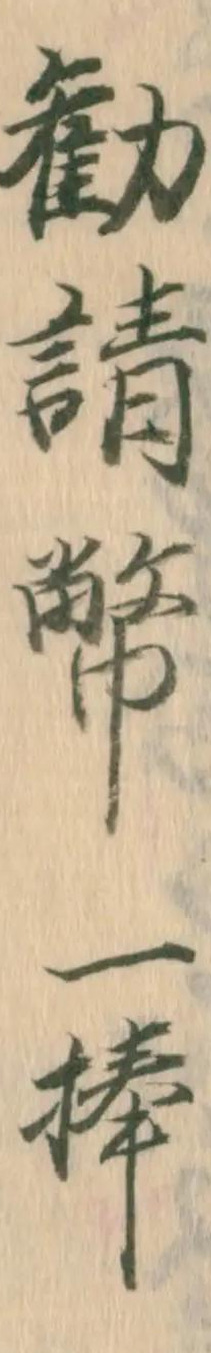勧請幣一棒
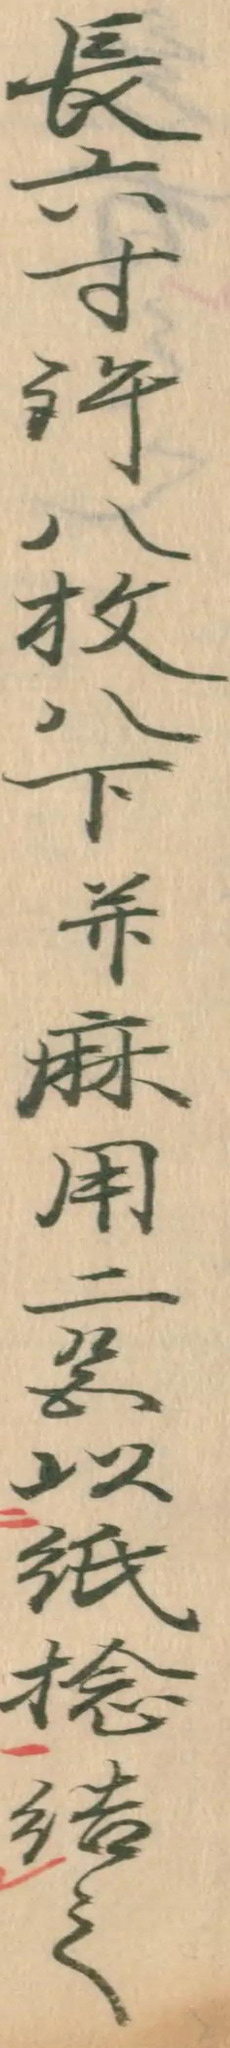長六寸許八枚八下并麻用二色以紙捻結之
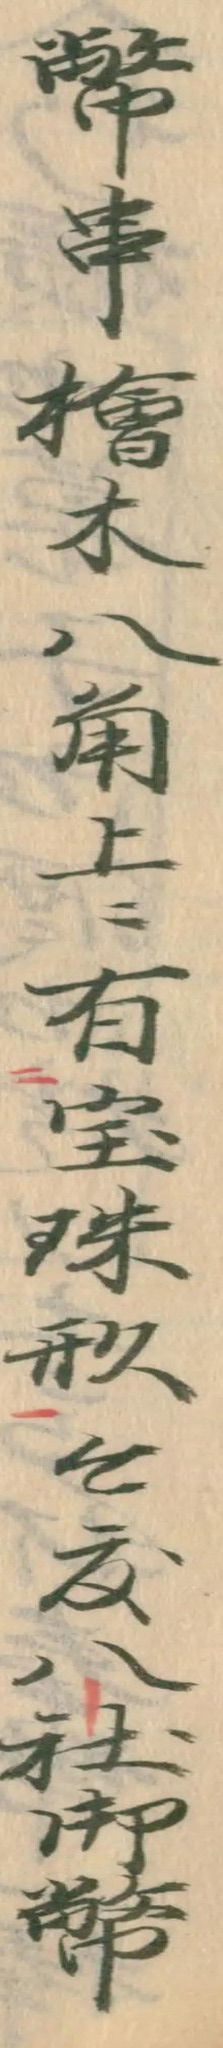幣串檜木八角上ニ有宝珠形今度八-社御幣
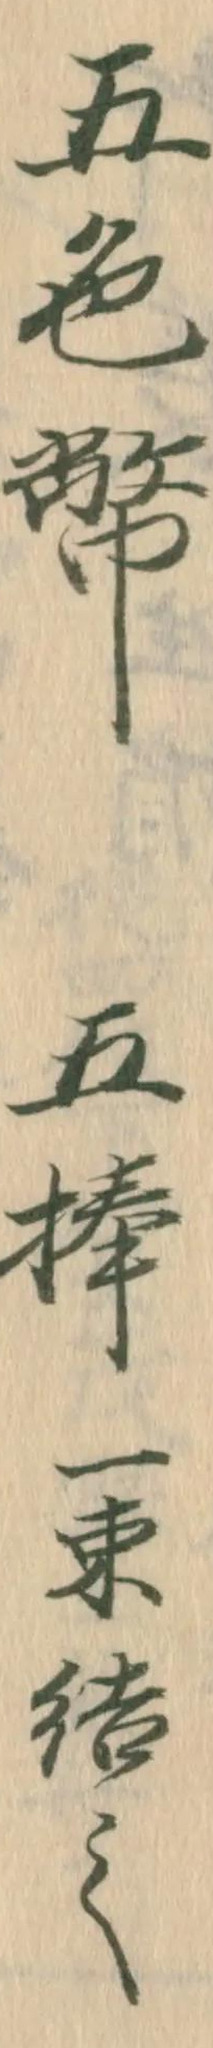五色幣五棒一束結之
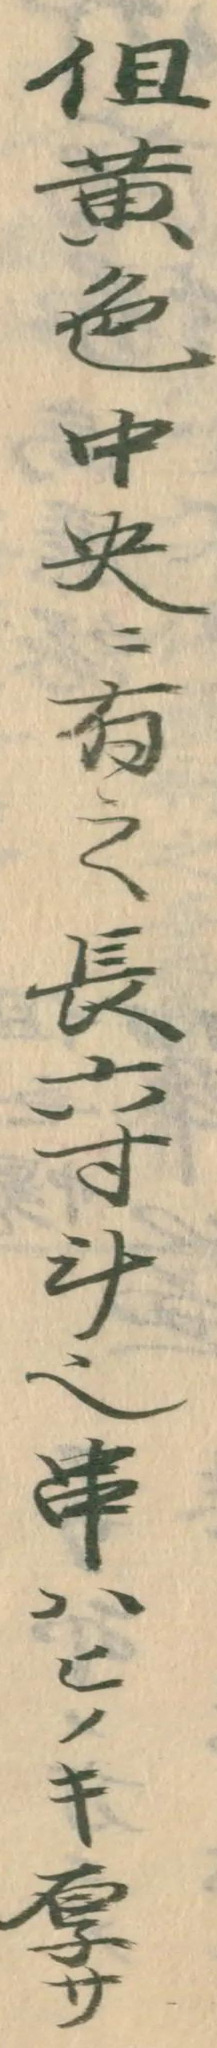但黄色中央ニ有之長六寸計也串ハヒノキ厚サ
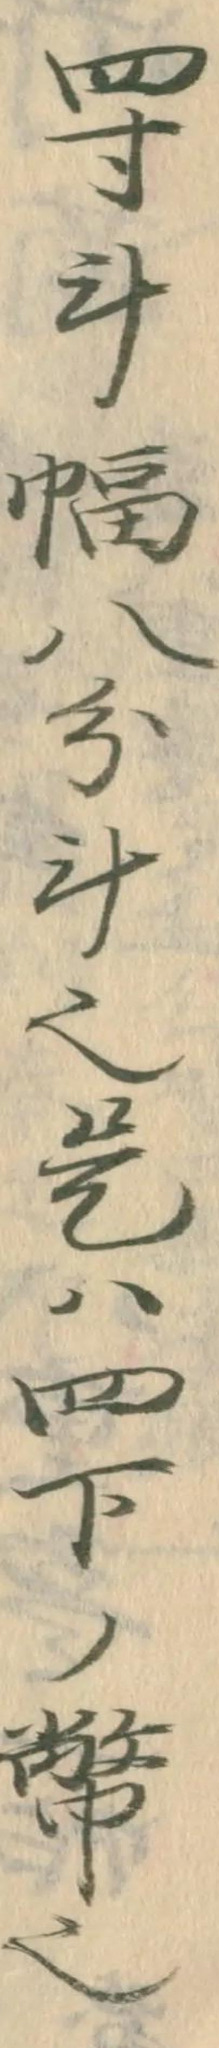四寸計幅八分計也是ハ四下ノ幣也
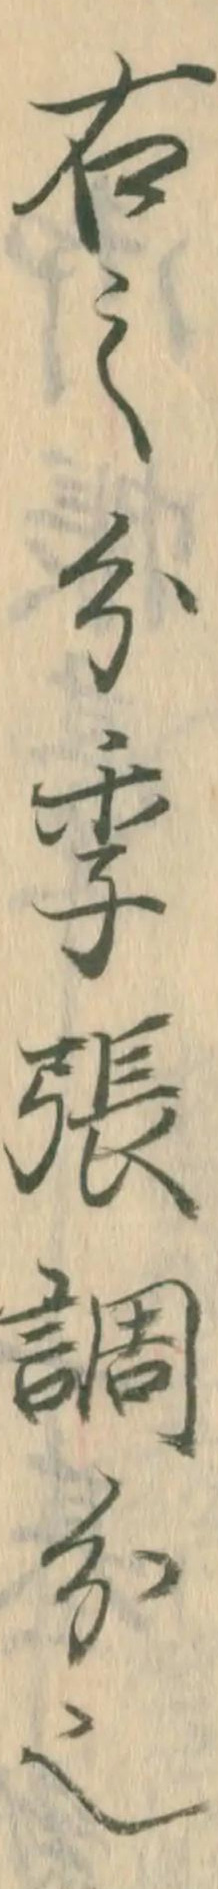右之分季張調分也

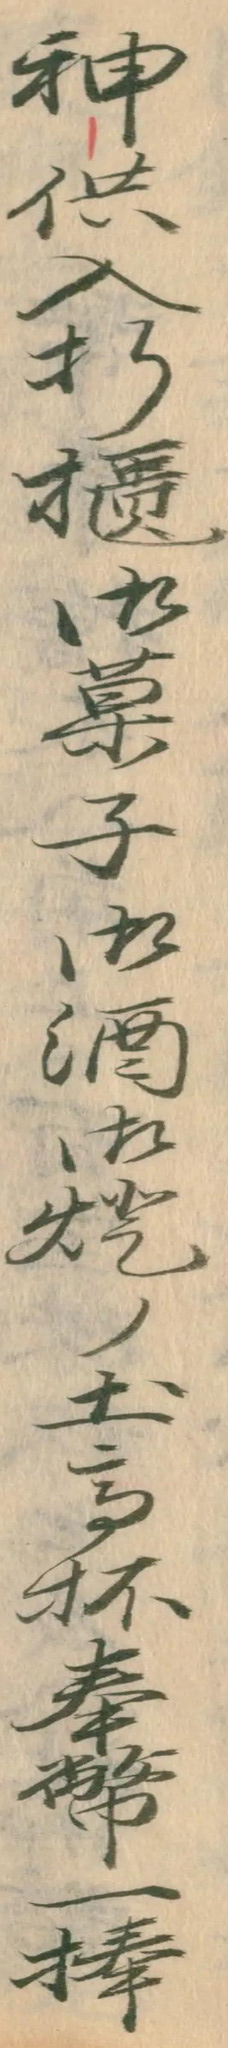神-供入折櫃御菓子御酒御燈ノ土高坏奉幣一捧
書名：賀茂社記録. 第16冊
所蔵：国立国会図書館 National Diet Library, JAPAN
